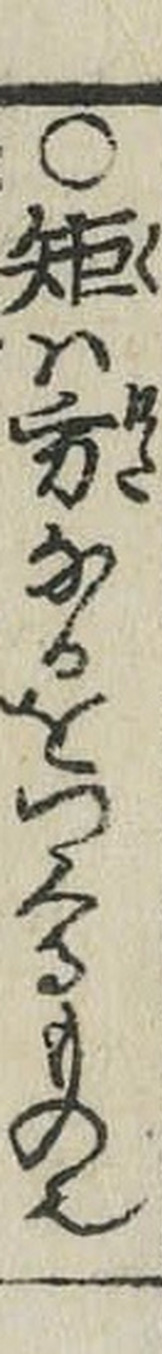○矩は方なるをつくるもの也
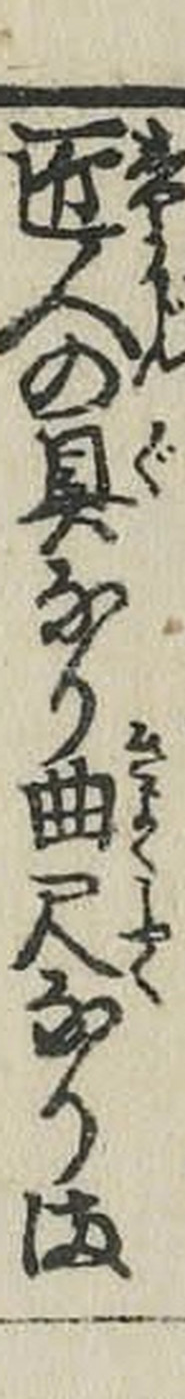匠人の具なり曲尺なりま
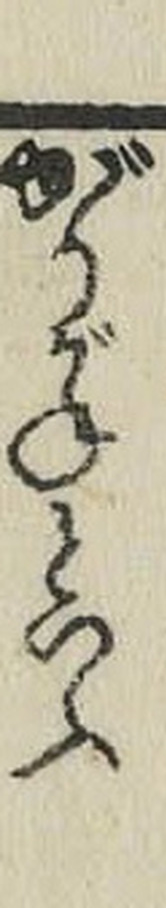がりがねといふ
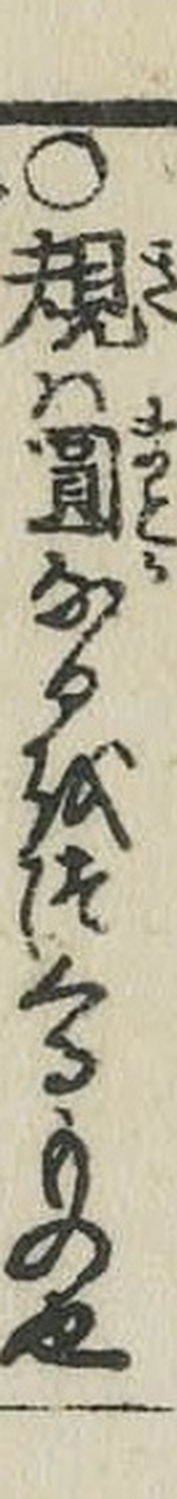○規は円なるをつくるもの也
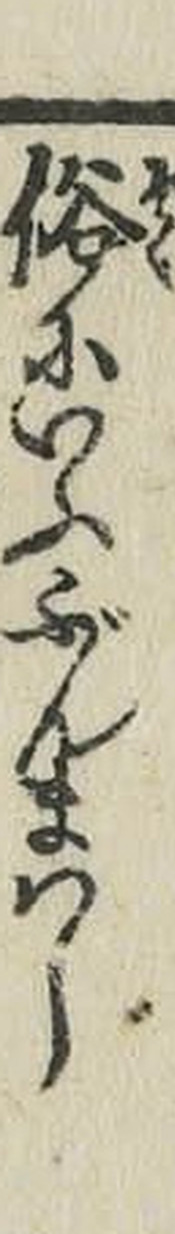俗にいふぶんまはし
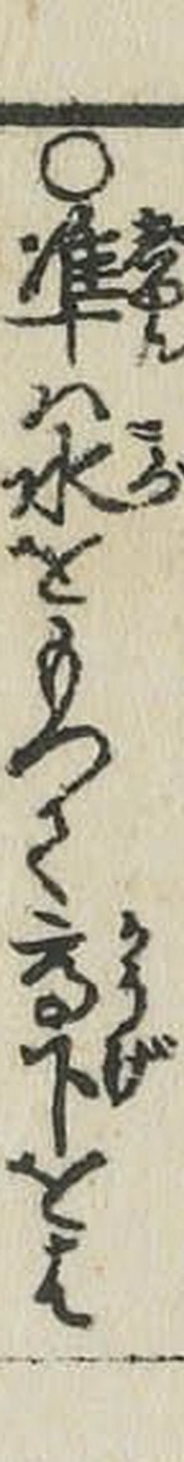○凖は水をもつて高下をは
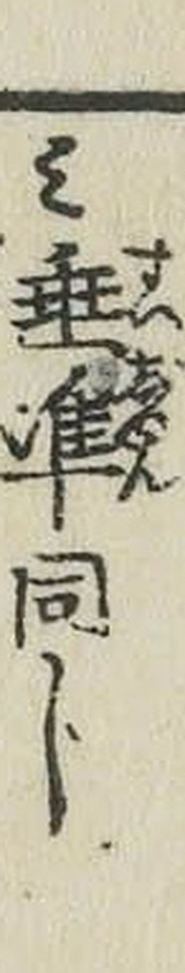み垂凖同じ
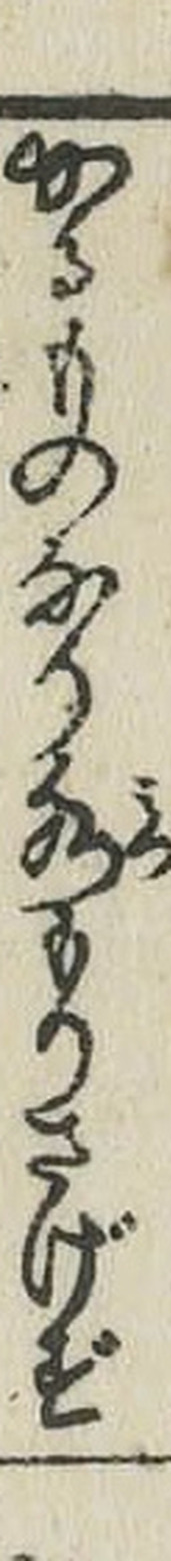かるものなり水もりさげず
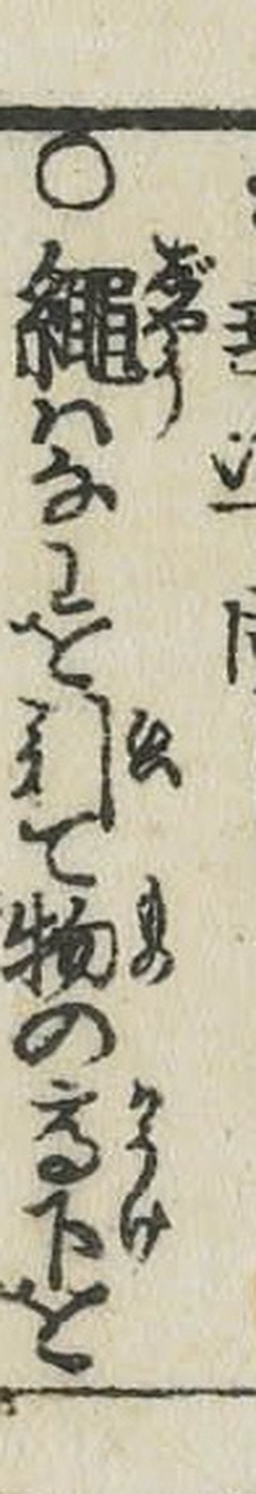○縄はなわを引て物の高下を
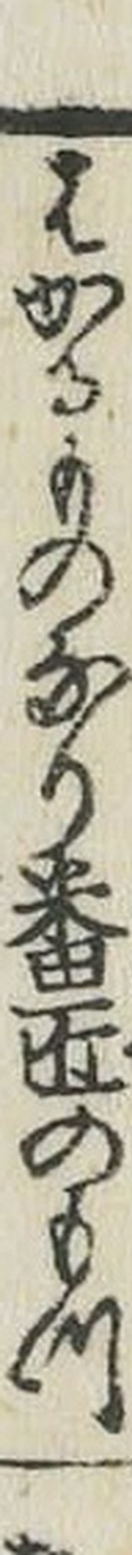はかるものなり番匠のもつ
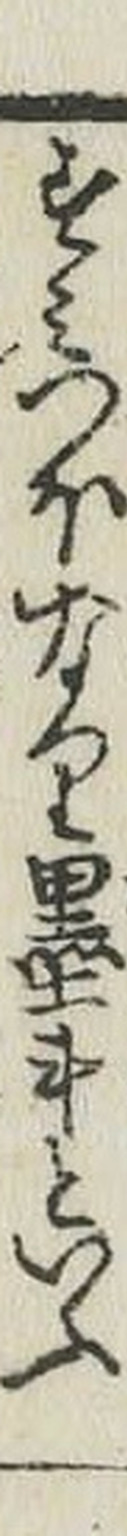すみつほなり墨斗といふ
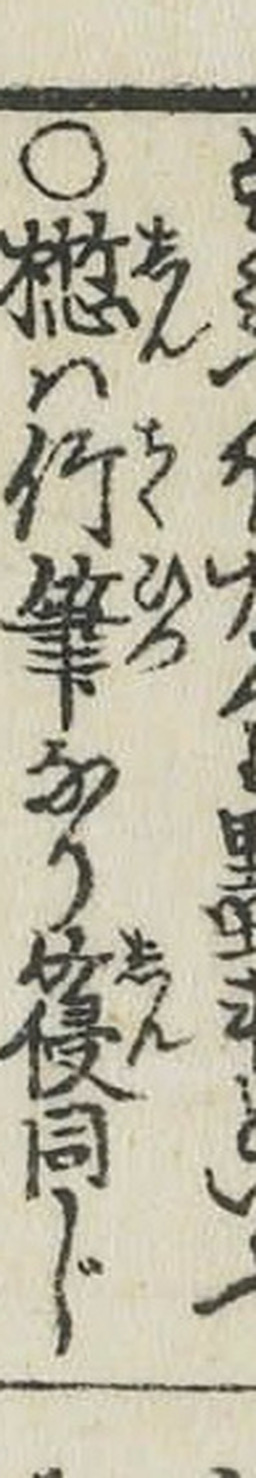○𣖯は竹筆なり▢同じ
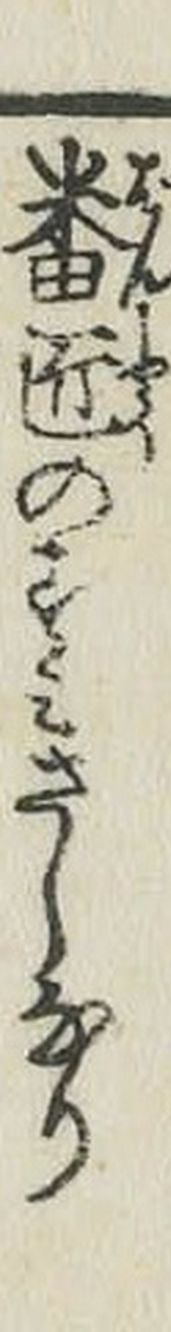番匠のすみさしなり
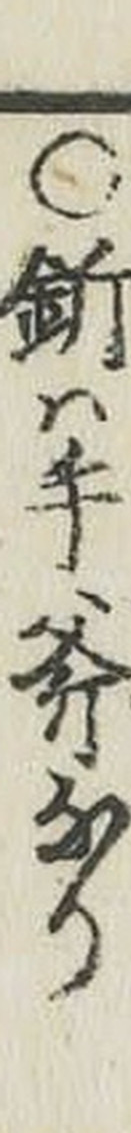○釿は手斧なり
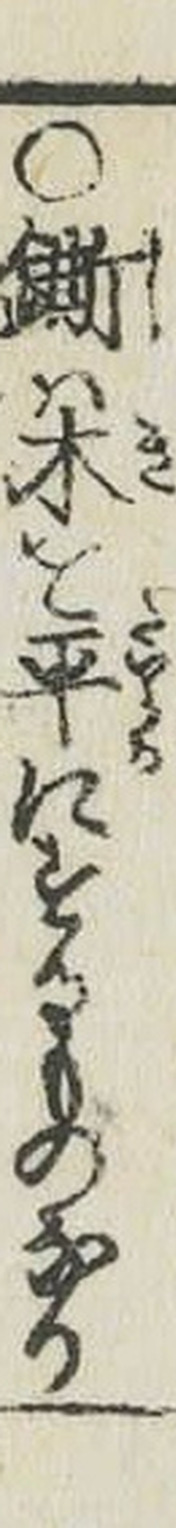○鐁は木を平にするものなり
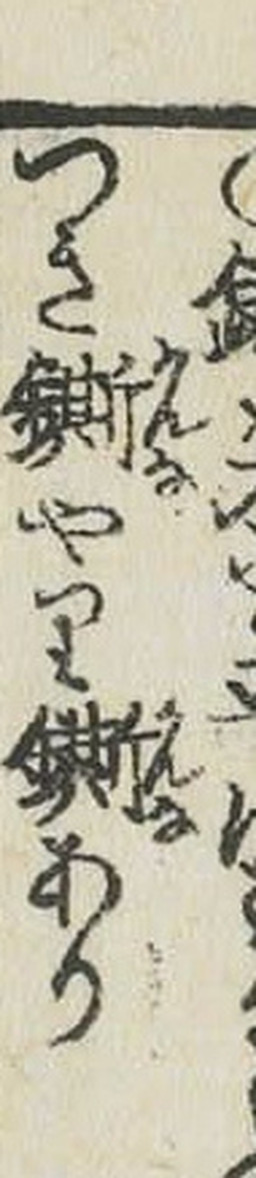つき鐁やり鐁あり
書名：増補頭書訓蒙図彙大成 10巻 5:巻之9-11
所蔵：東京学芸大学教育コンテンツアーカイブ
